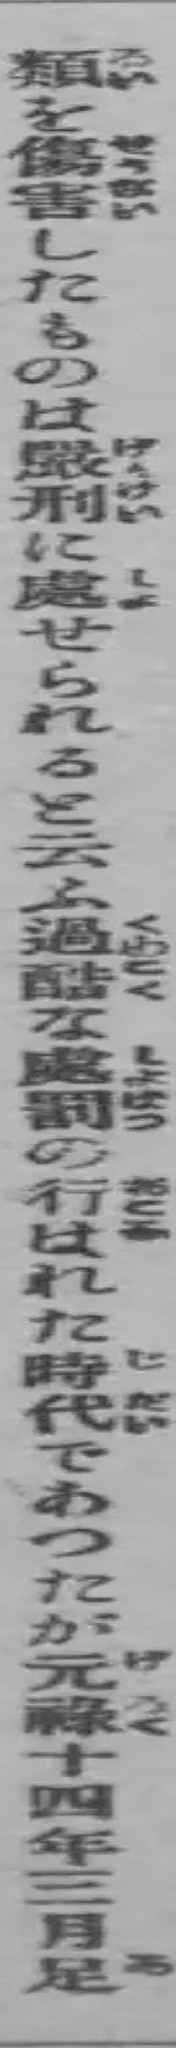類を傷害したものは厳刑に処せられると云ふ過酷な処罰の行はれた時代であつたが元禄十四年三月足
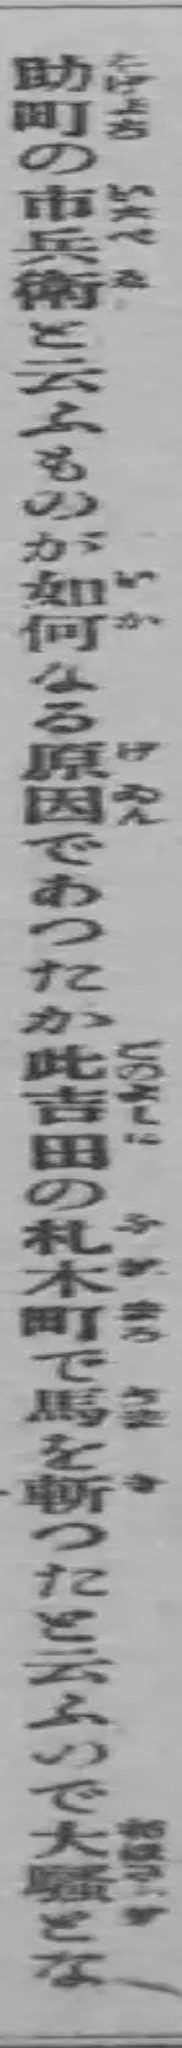助町の市兵衛と云ふものが如何なる原因であつたか此吉田の札木町で馬を斬つたと云ふので大騒とな
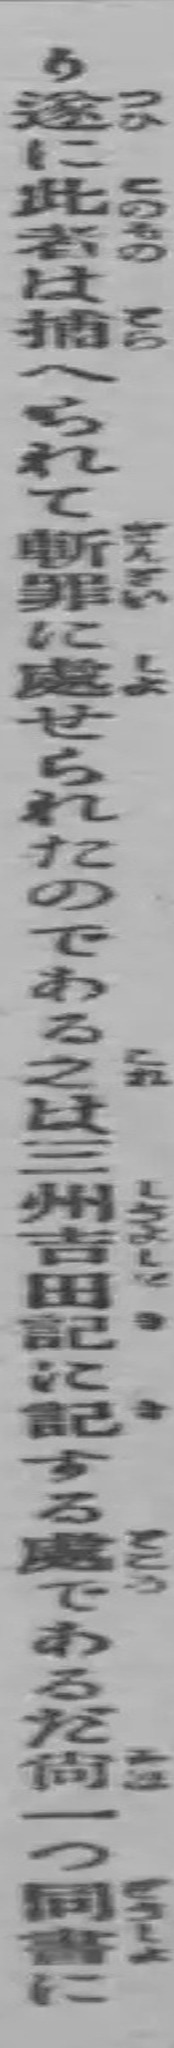孝子旌表り遂に此者は捕へられて斬罪に処せられたのである之は三州吉田記に記する処であるだ尚一つ同書に
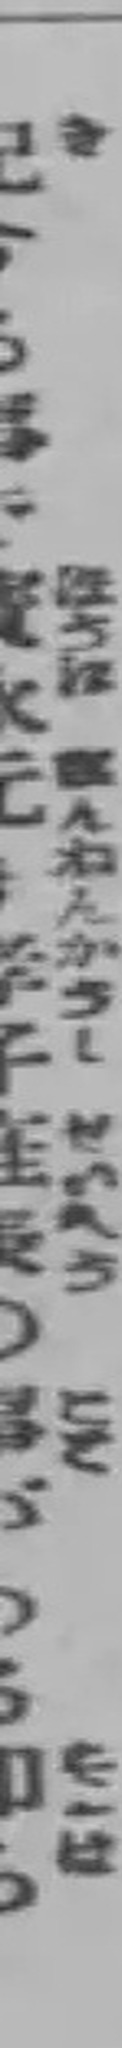記する事で宝永元年孝子旌表の事がある即ち
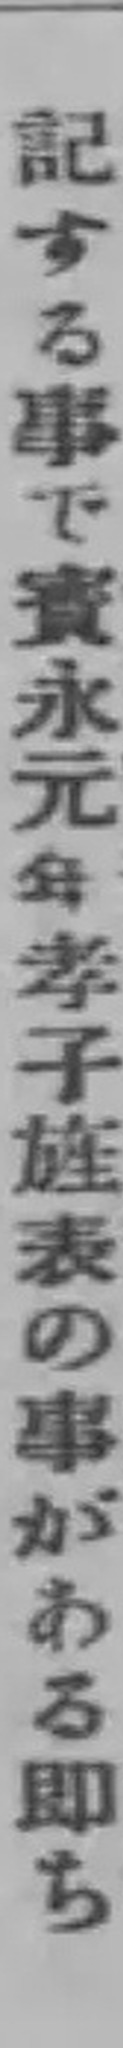記する事で宝永元年孝子旌表の事がある即ち
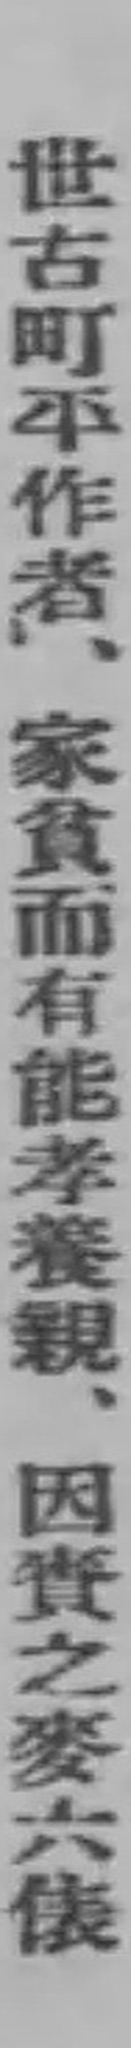世古町平作者、家貧而有能孝養親、因賚之麦六俵
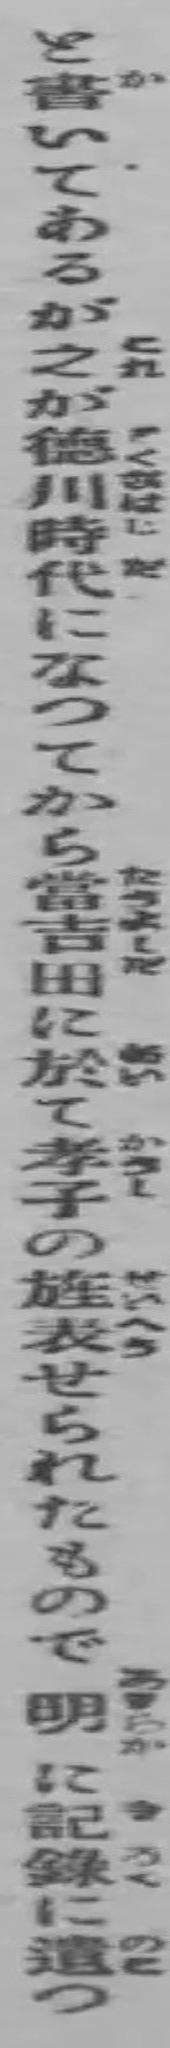と書いてあるが之が徳川時代になつてから当吉田に於て孝子の旌表せられたもので明に記録に遺つ
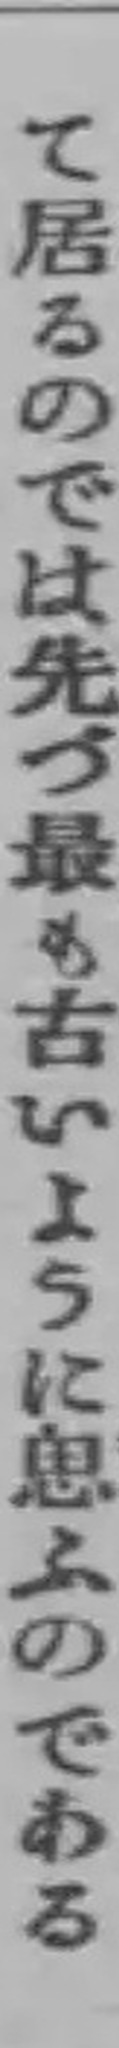て居るのでは先づ最も古いように思ふのである
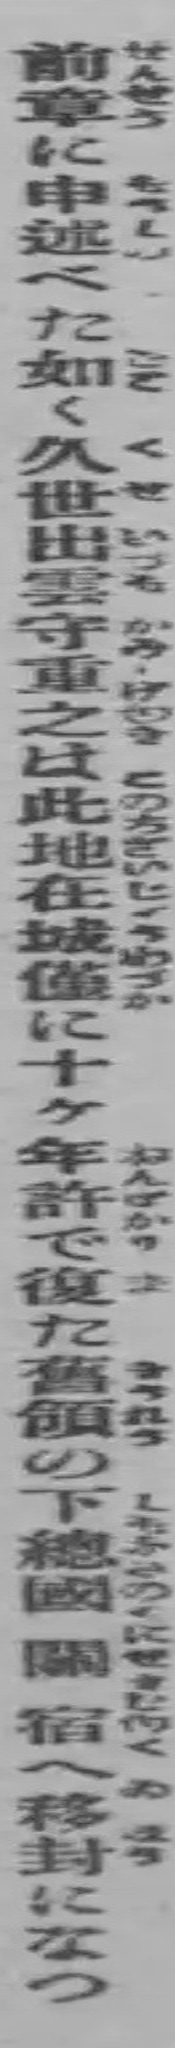前章に申述べた如く久世出雲守重之は此地在城僅に十ケ年許で復た旧領の下総国関宿へ移封になつ
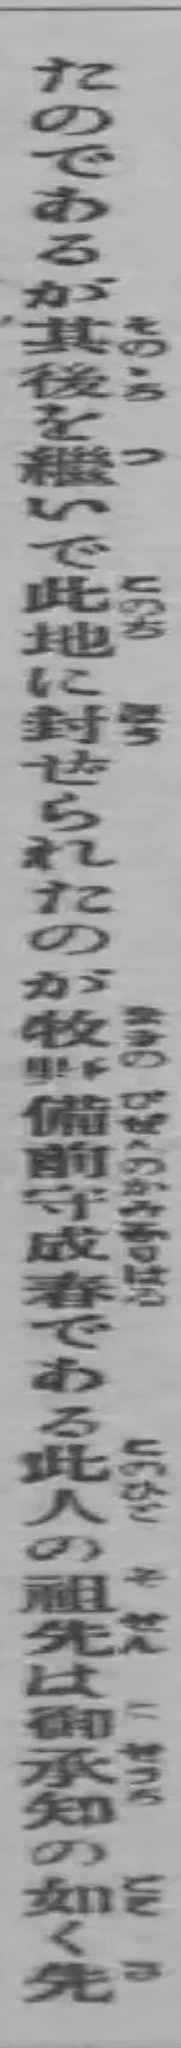牧野成春たのであるが其後を継いで此地に封ぜられたのが牧野備前守成春である此人の祖先は御承知の如く先
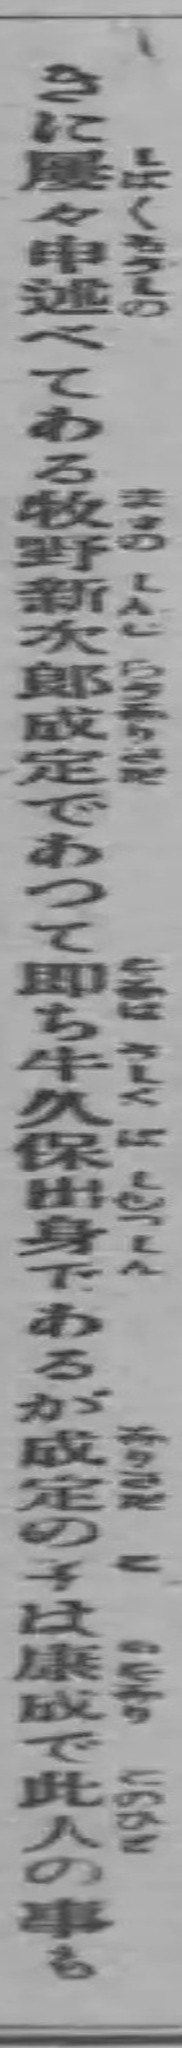きに屡々申述べてある牧野新次郎成定であつて即ち牛久保出身であるが成定の子は康成で此人の事も

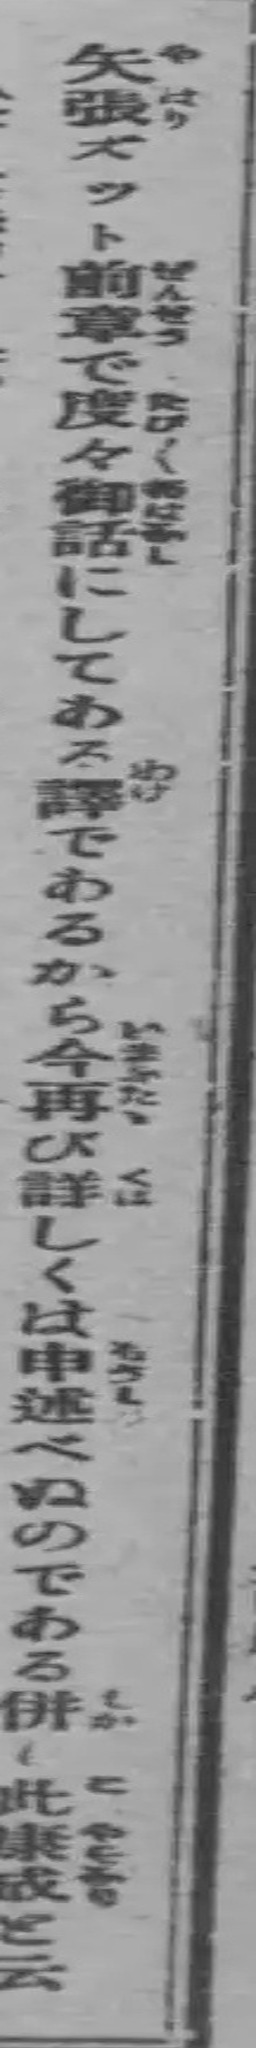矢張ズツト前章で度々御話にしてある訳であるから今再び詳しくは申述べぬのである併し此康成と云
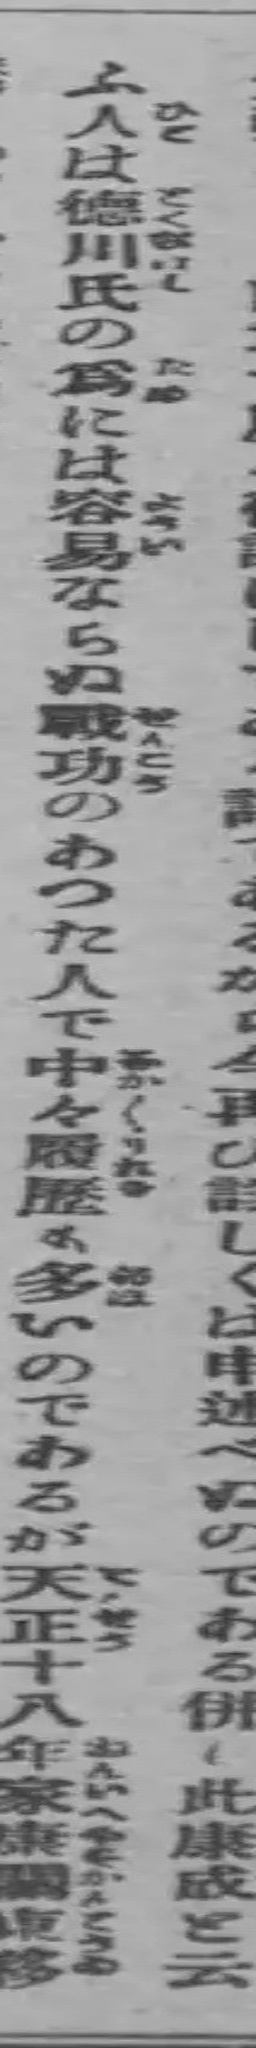ふ人は徳川氏の為には容易ならぬ戦功のあつた人で中々履歴も多いのであるが天正十八年家康関東移
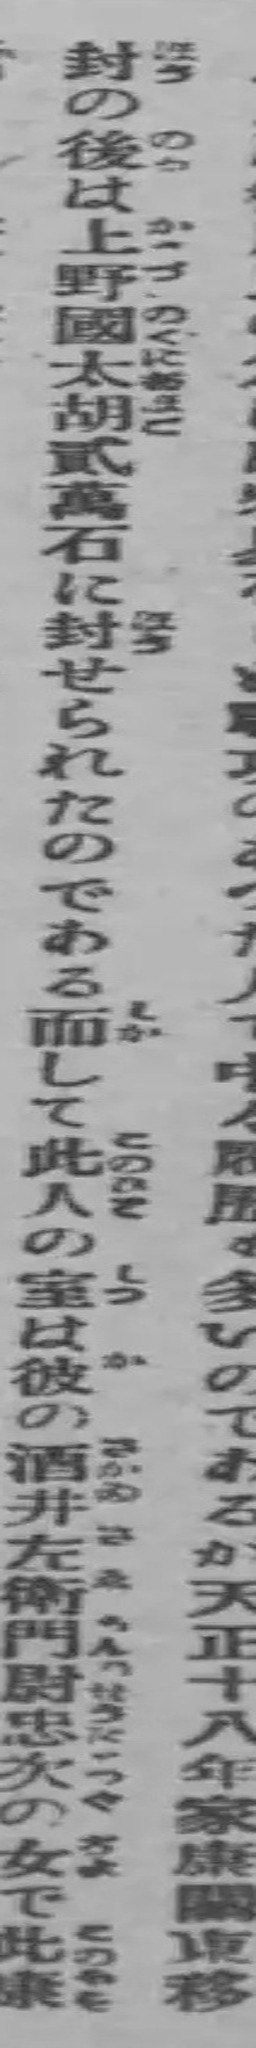封の後は上野国太胡弐万石に封せられたのである而して此人の室は彼の酒井左衛門尉忠次の女で此康
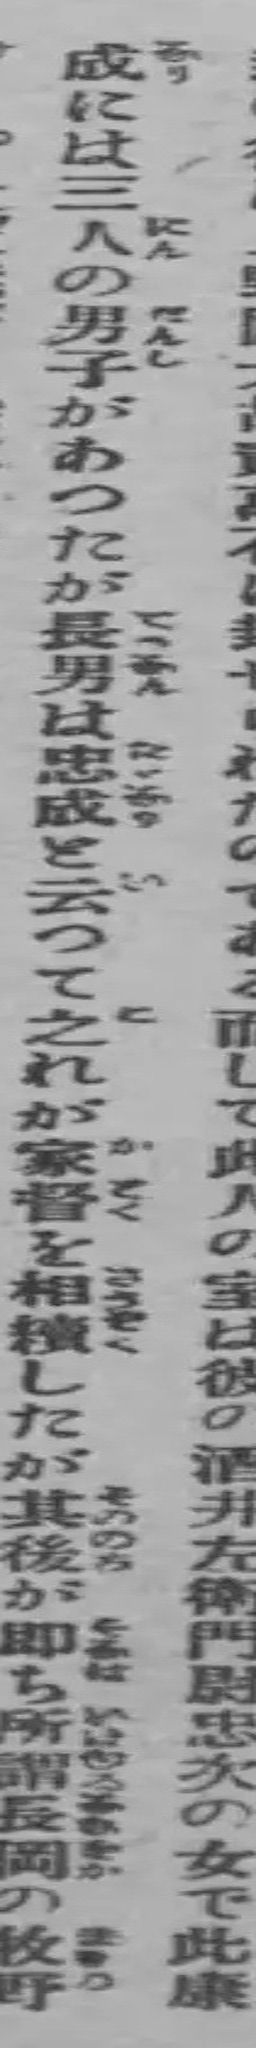長岡牧野家成には三人の男子があつたが長男は忠成と云つて之れが家督を相続したが其後が即ち所謂長岡の牧野
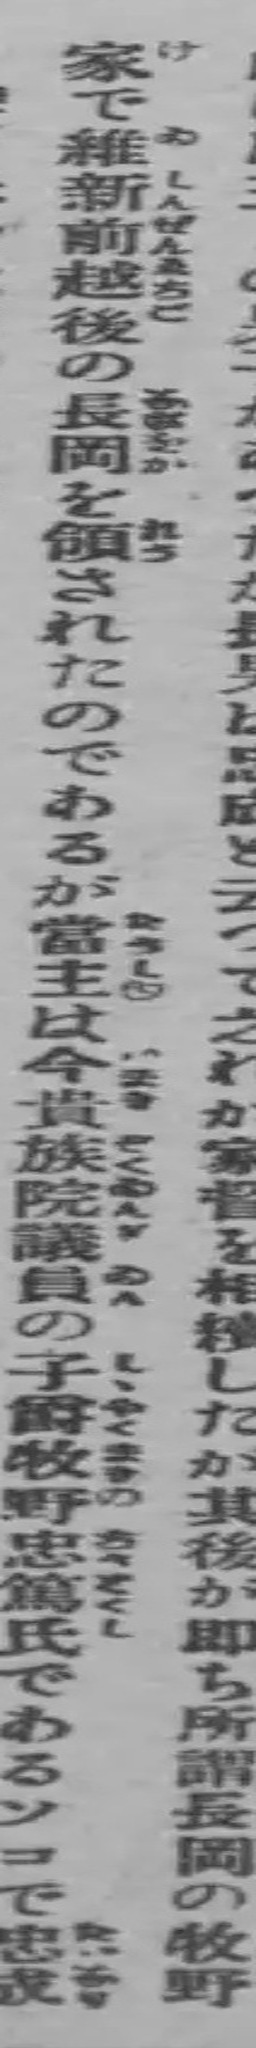家で維新前越後の長岡を領されたのであるが当主は今貴族院議員の子爵牧野忠篤氏であるソコで忠成
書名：豊橋市史談
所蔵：国立国会図書館 National Diet Library, JAPAN
